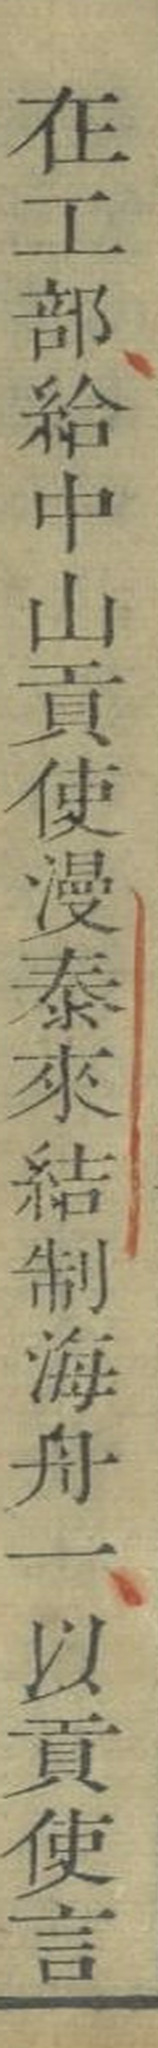在工部給中山貢使漫泰来結制海舟一以貢使言
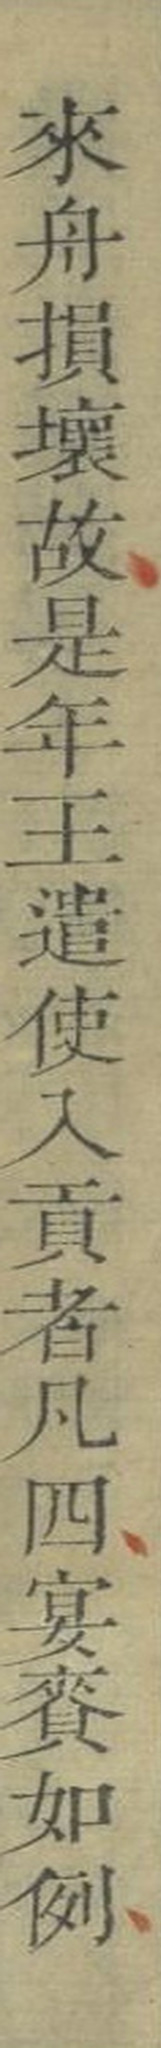来舟損壊故是年王遣使入貢者凡四宴賚如例
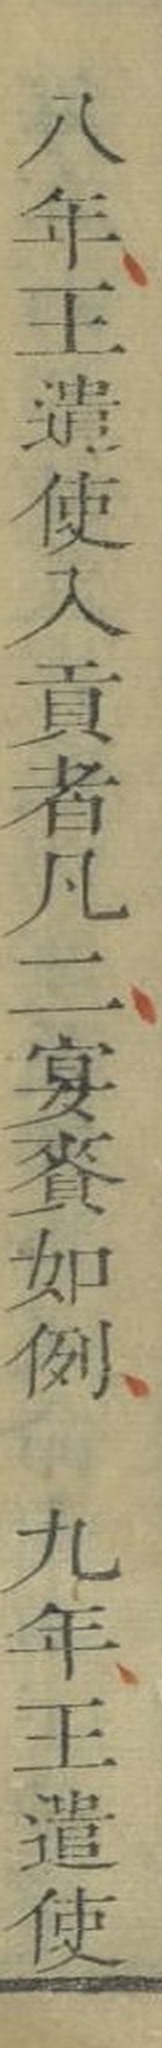八年王遣使入貢者凡二宴賚如例九年王遣使
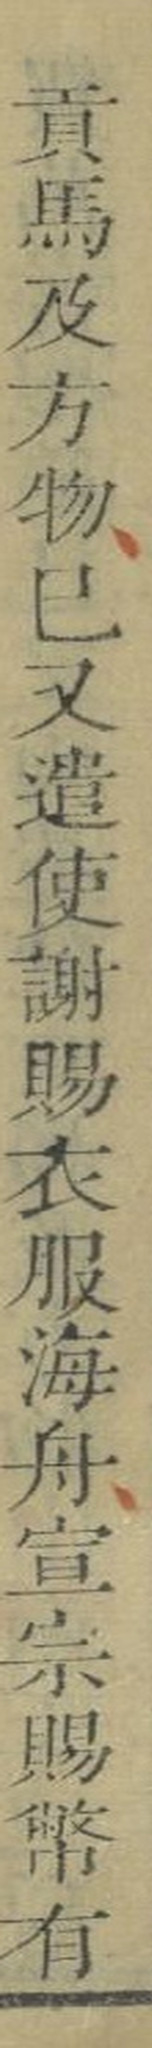貢馬及方物巳又遣使謝賜衣服海舟宣宗賜幣有
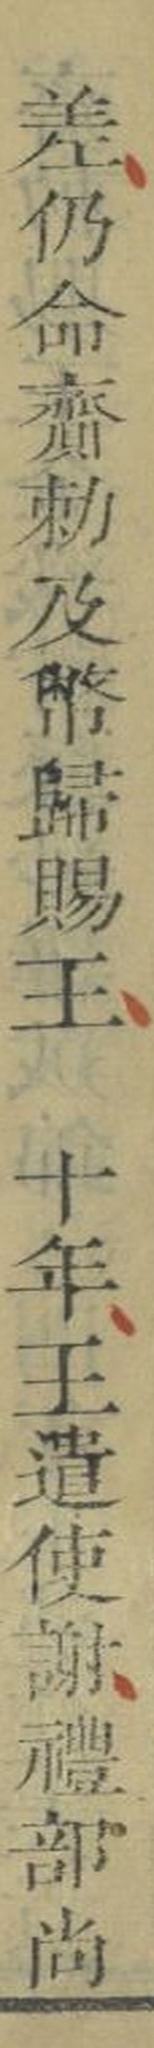差仍命齎勅及幣帰賜王十年王遣使謝礼部尚
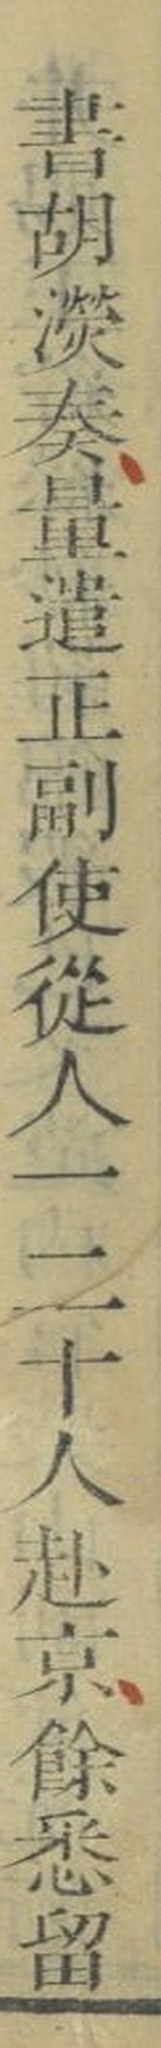書胡濙奏量遣正副使従人一二十人赴京余悉留
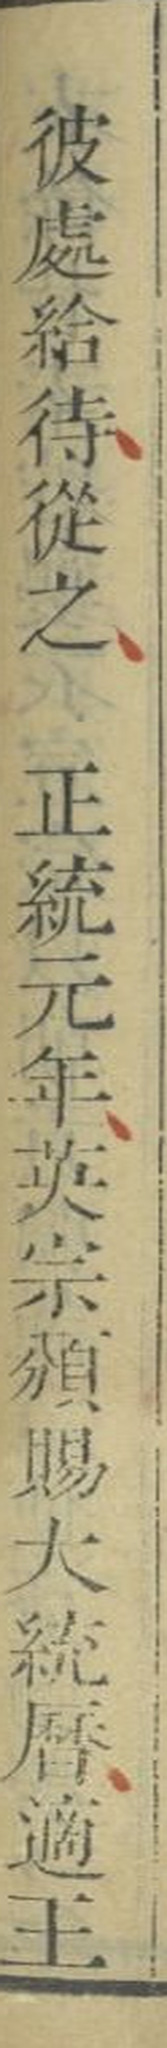彼処給待従之正統元年英宗頒賜大統暦適王
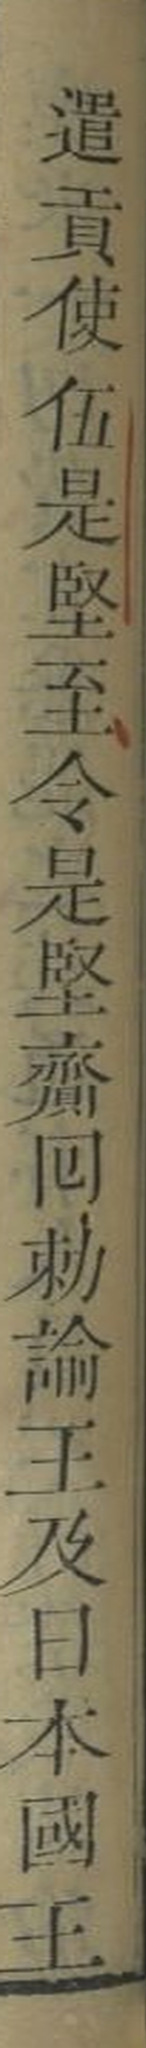遣貢使伍是堅至令是堅齎回勅諭王及日本国王
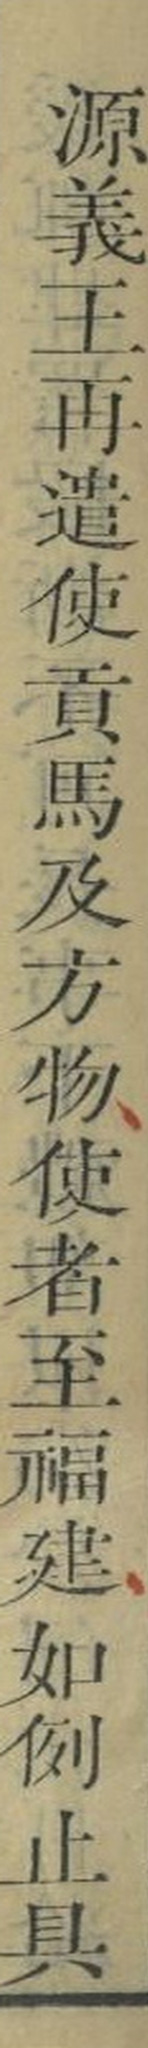源義王再遣使貢馬及方物使者至福建如例止具
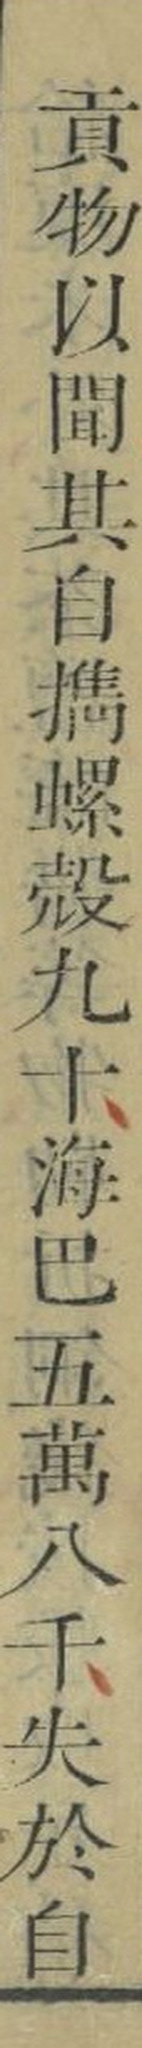貢物以聞其自携螺殻九十海巴五万八千失於自
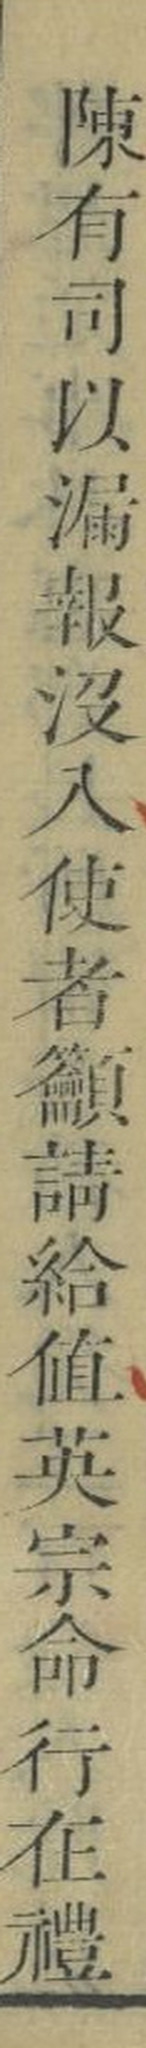陳有司以漏報没入使者籲請給値英宗命行在礼
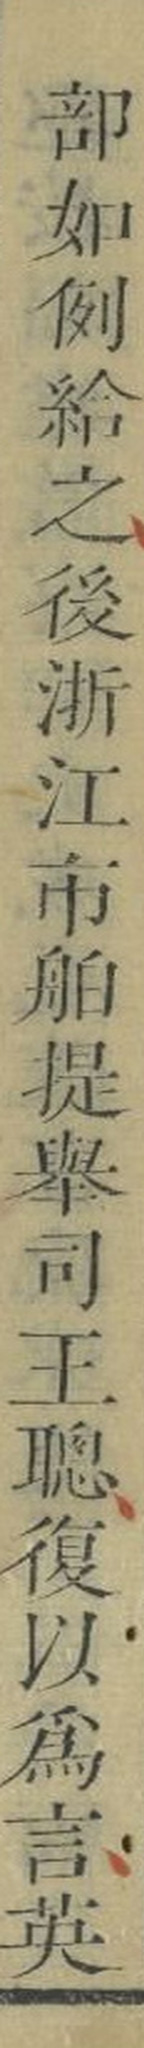部如例給之後浙江市舶提挙司王聡復以為言英
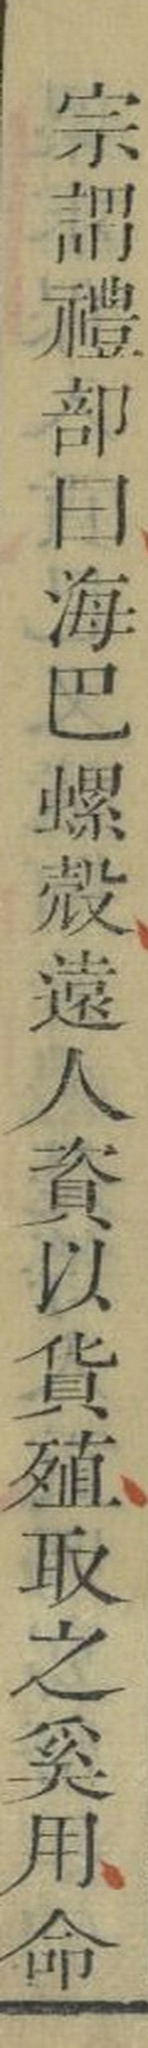宗謂礼部曰海巴螺殻遠人資以貨殖取之奚用命
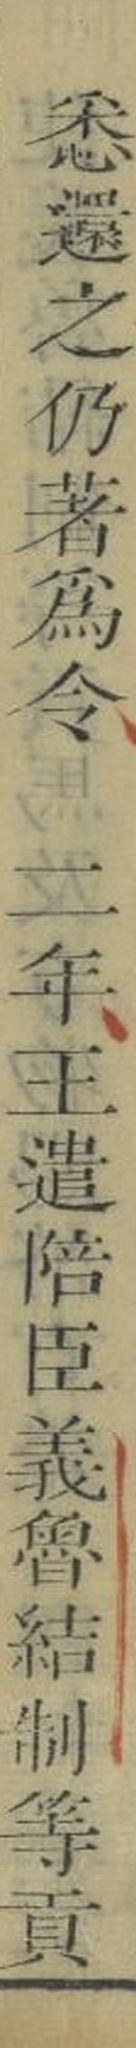悉還之仍著為令二年王遣陪臣義魯結制等貢
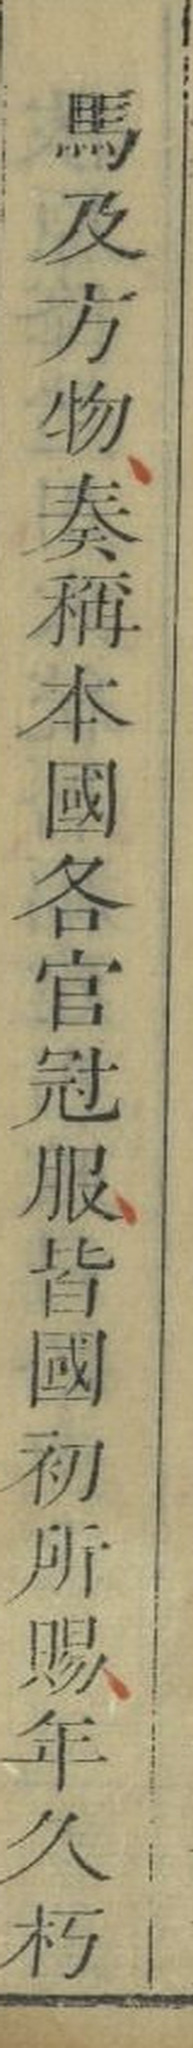馬及方物奏称本国各官冠服皆国初所賜年久朽
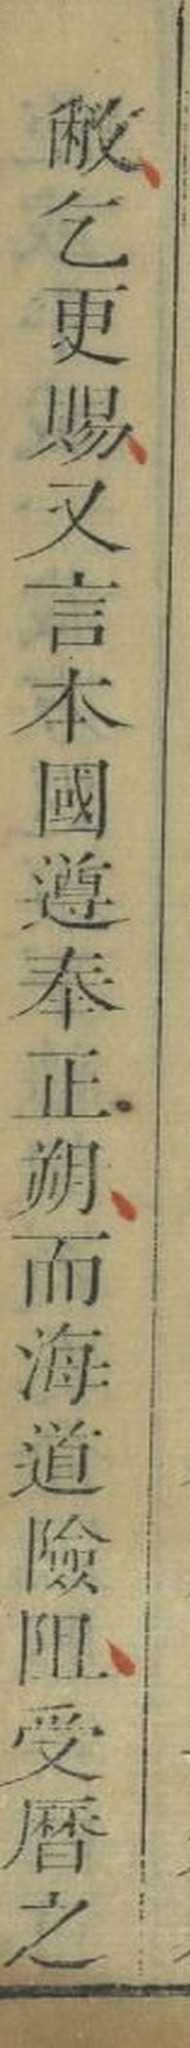敝乞更賜又言本国遵奉正朔而海道険阻受暦之
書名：中山伝信録 巻三
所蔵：University of the Ryukyus Library
